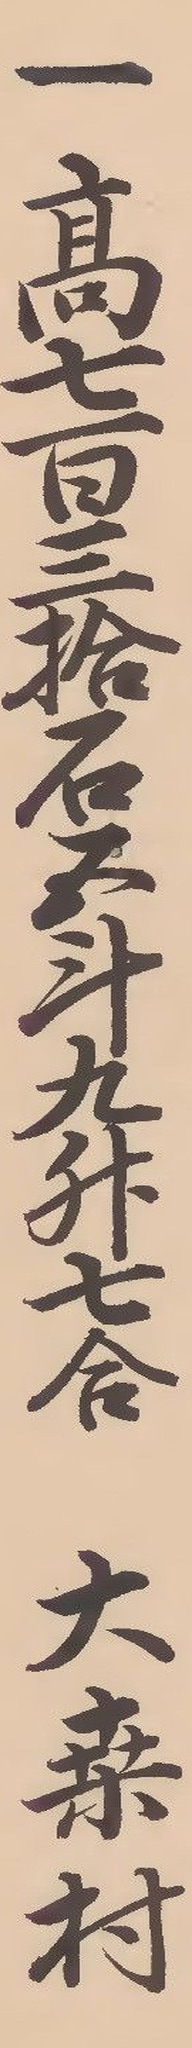一高七百三拾石五斗九升七合大桑村

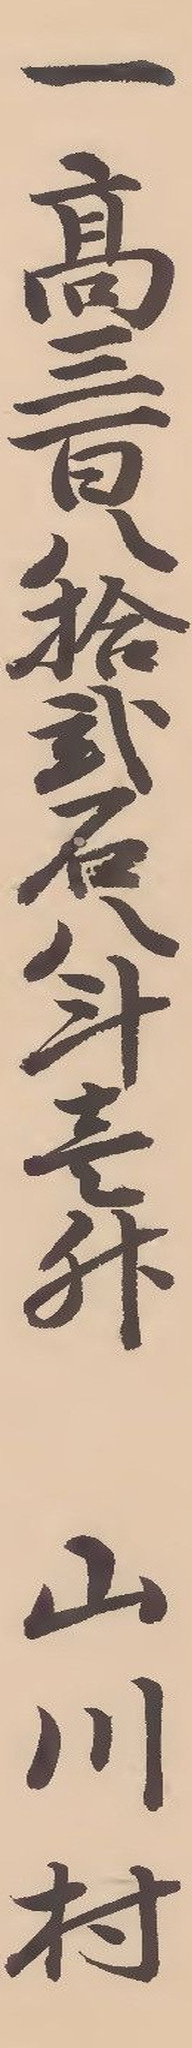一高三百八拾弐石八斗壱升山川村
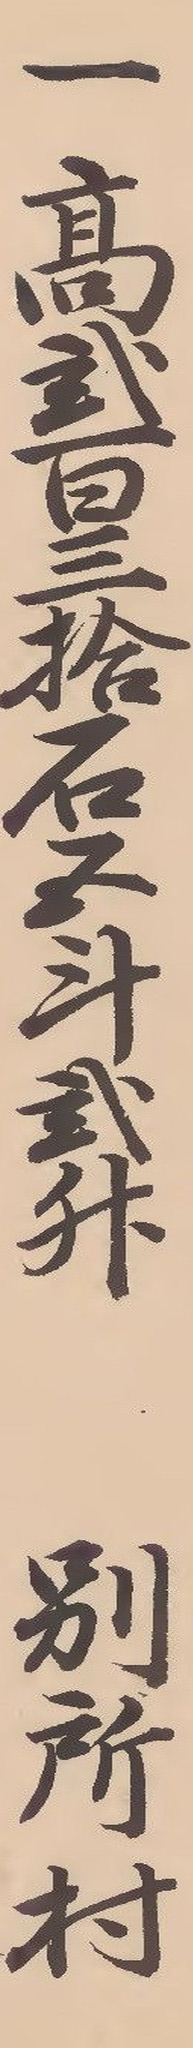一高弐百三拾石五斗弐升別所村
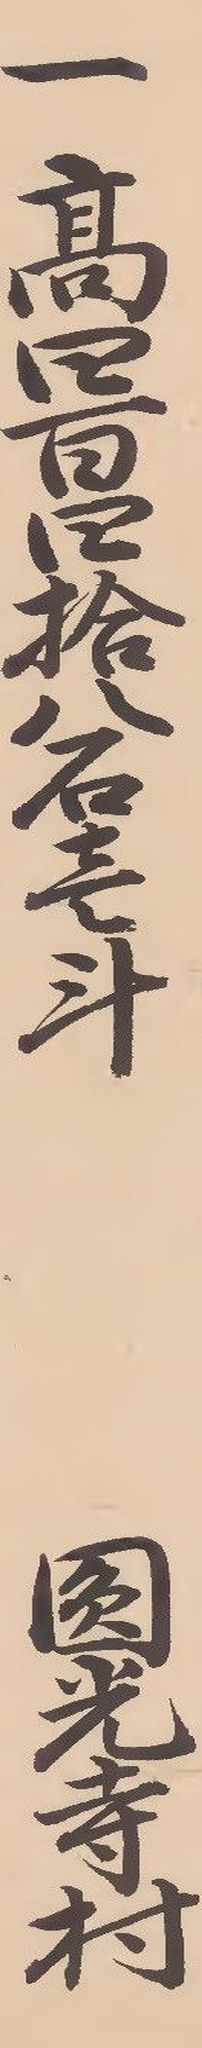一高四百四拾八石壱斗円光寺村
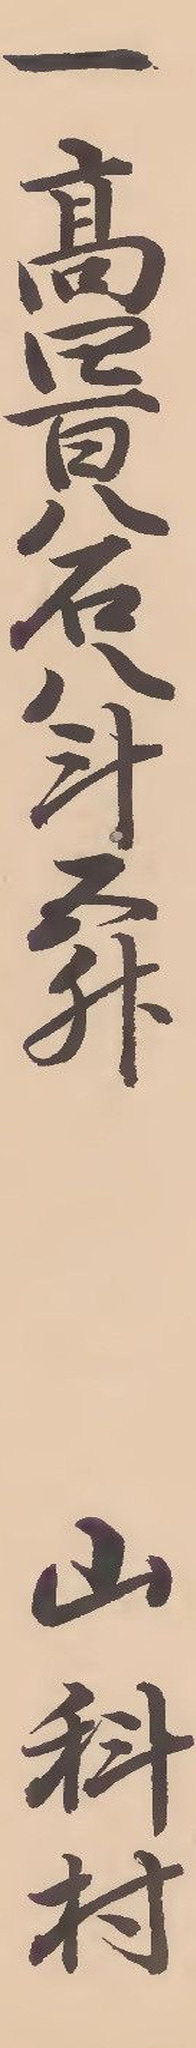一高四百八石八斗五升山科村

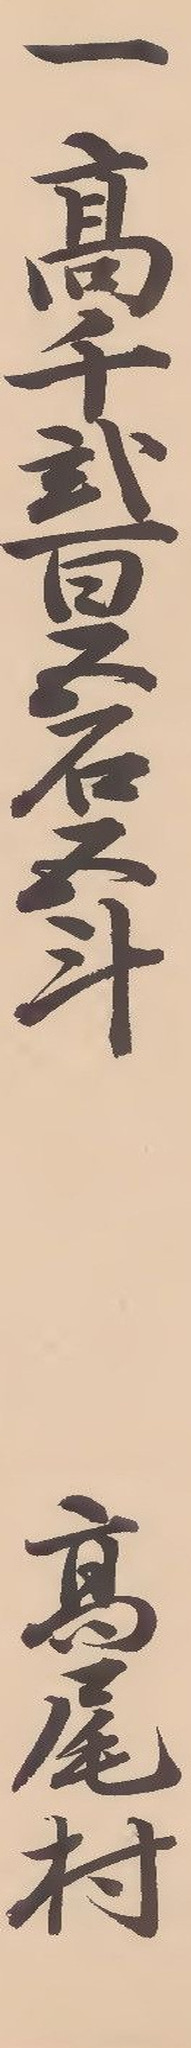一高千弐百五石五斗高尾村
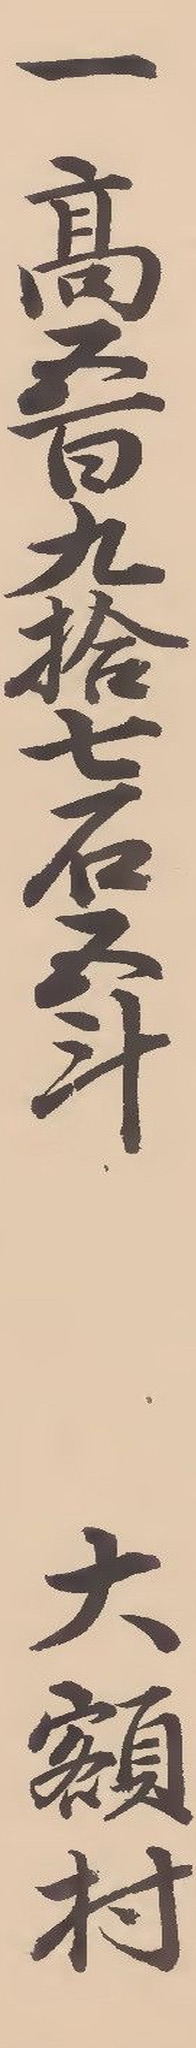一高五百九拾七石五斗大額村
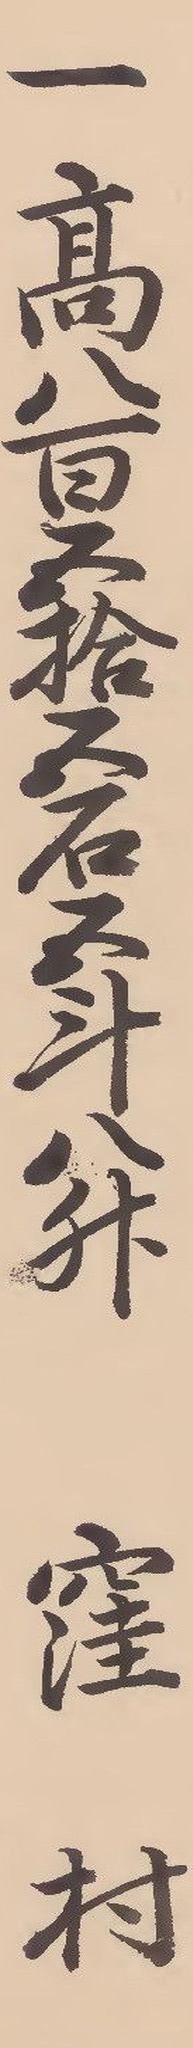一高八百五拾五石五斗八升窪村
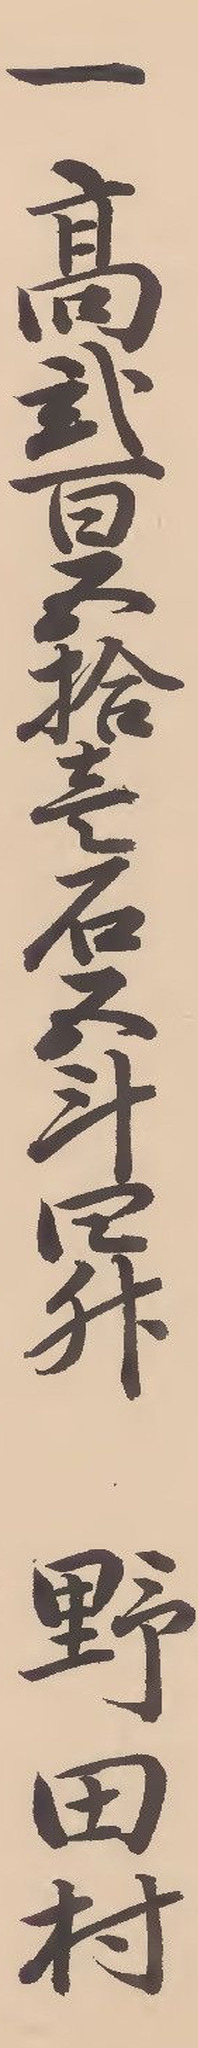一高弐百五拾壱石五斗四升野田村

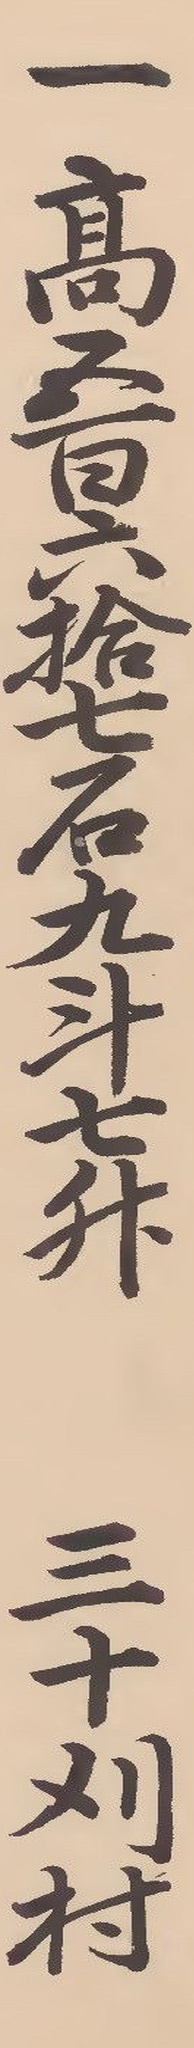一高五百六拾七石九斗七升三十刈村
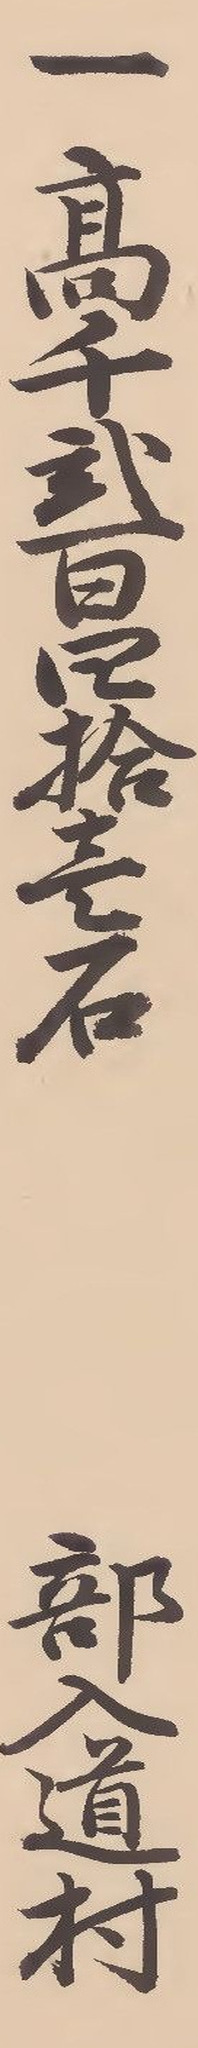一高千弐百四拾壱石部入道村
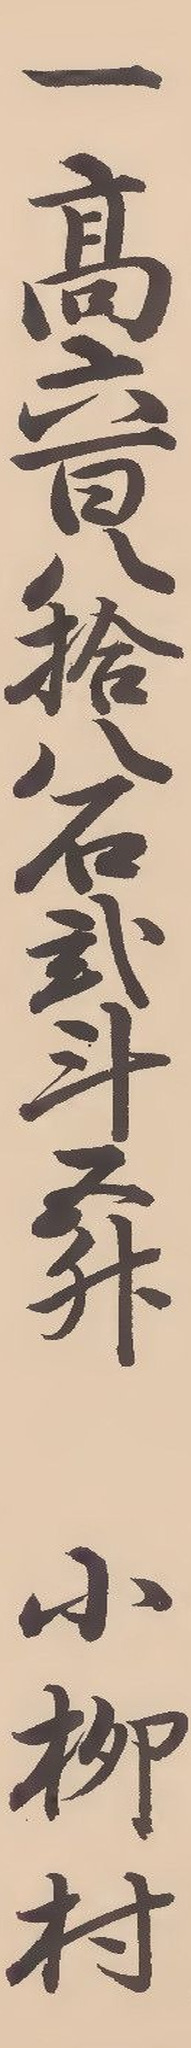一高六百八拾八石弐斗五升小柳村
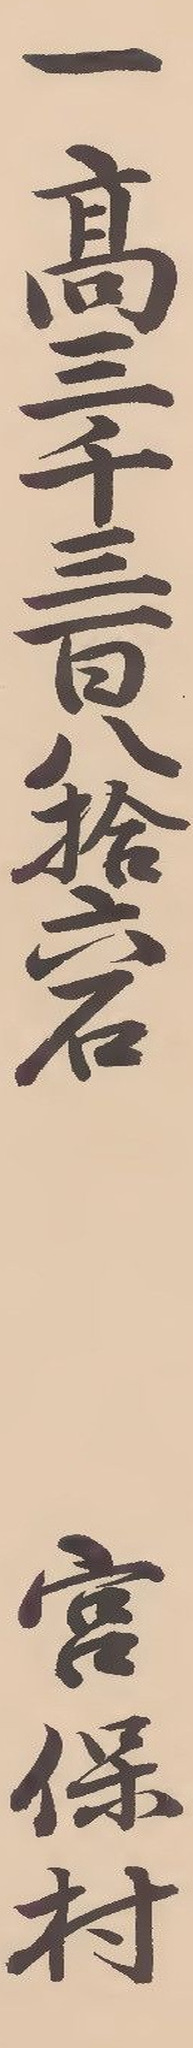一高三千三百八拾六石宮保村
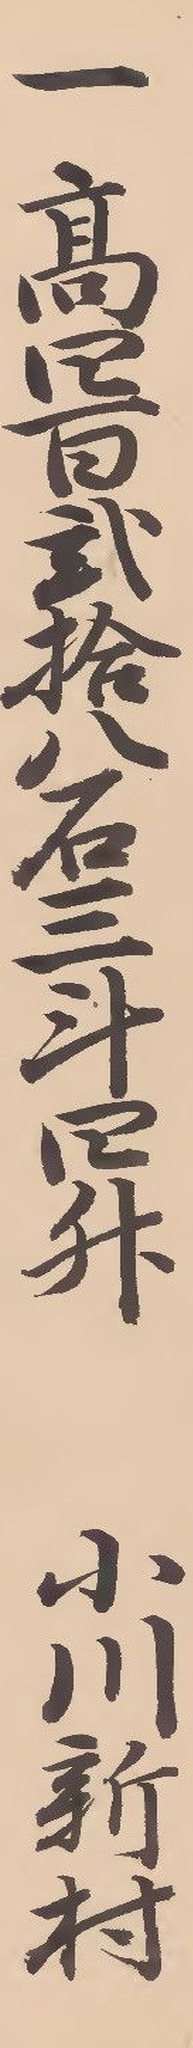一高四百弐拾八石三斗四升小川新村
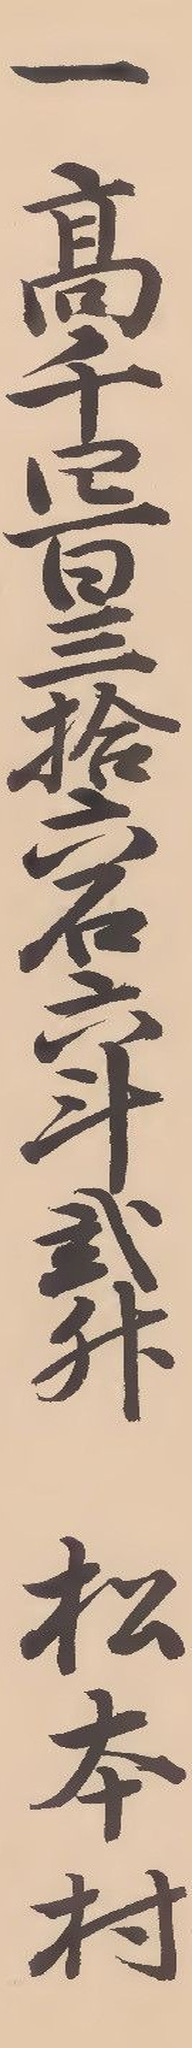一高千四百三拾六石六斗弐升松本村
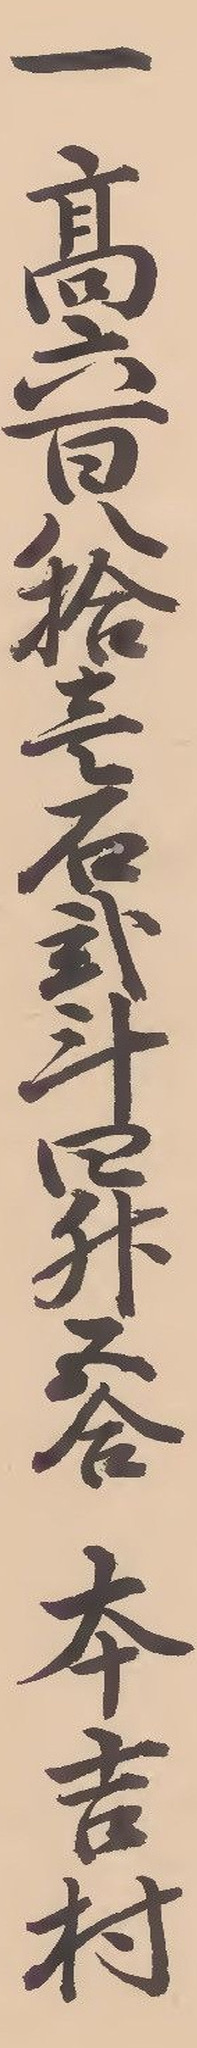一高六百八拾壱石弐斗四升五合本吉村
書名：加賀国郷帳
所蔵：国立公文書館 National Archives of Japan
